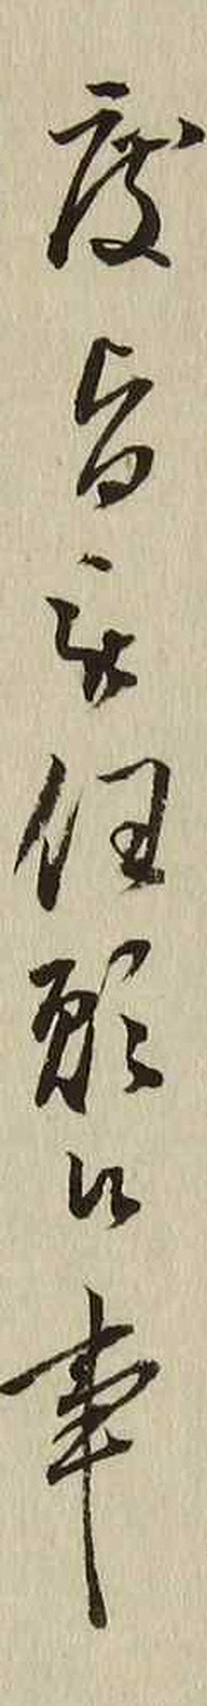度旨被任願候事
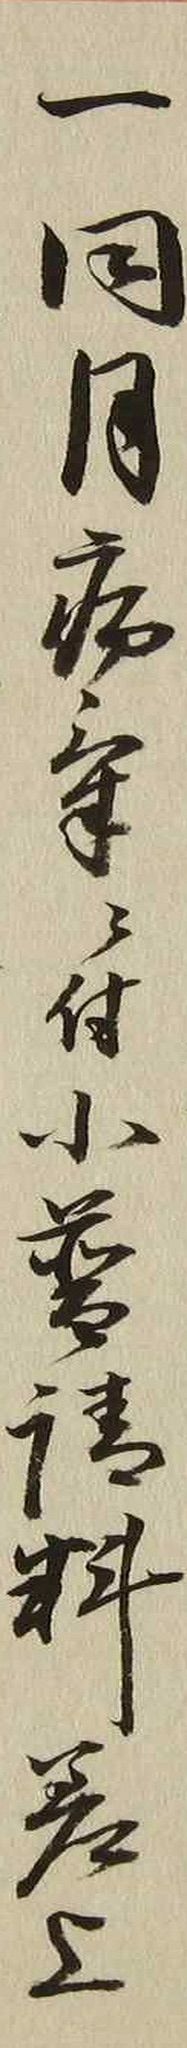一同月病気ニ付小普請料差上
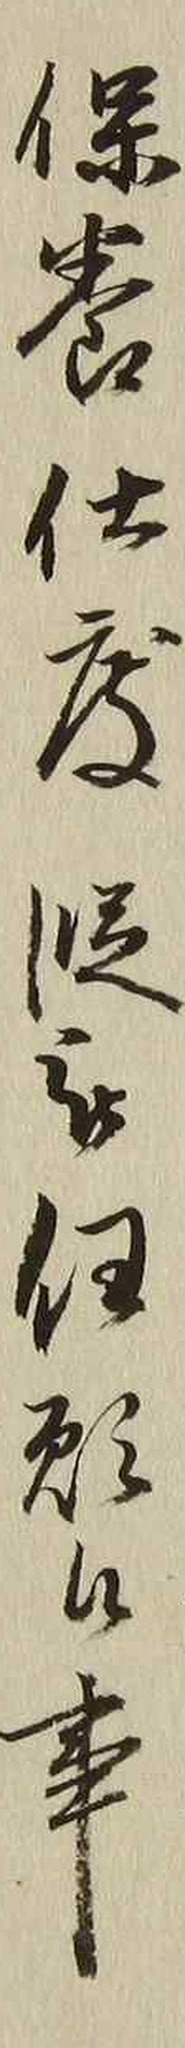保養仕度段被任願候事
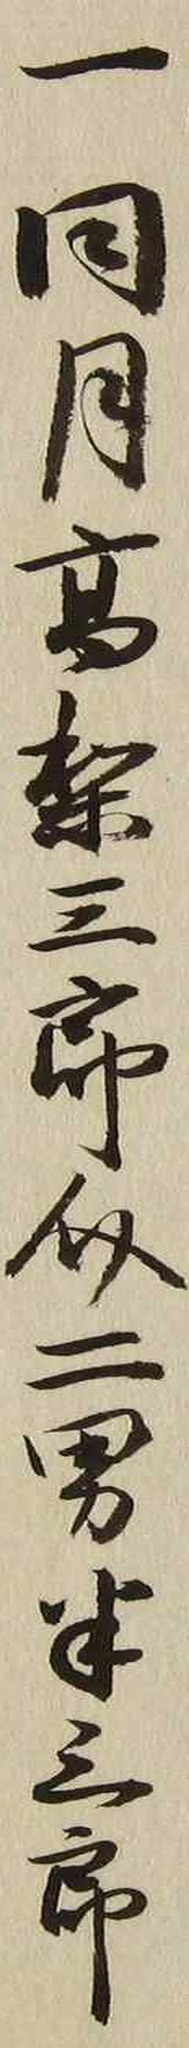一同月高梨三郎介二男半三郎
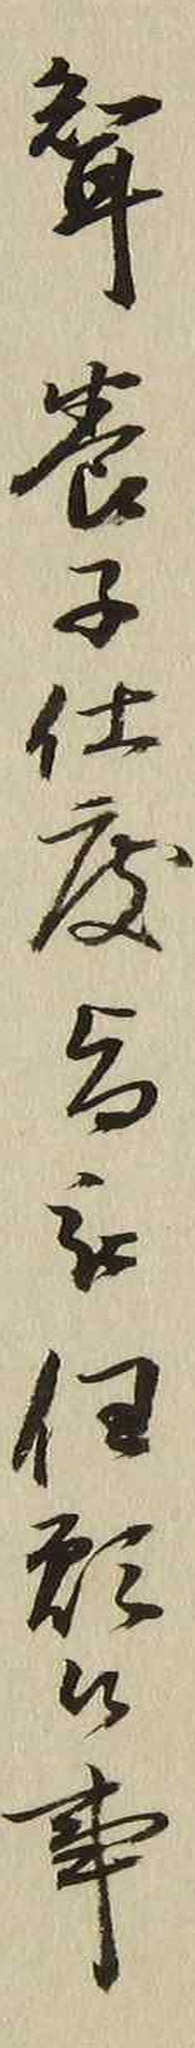婿養子仕度旨被任願候事
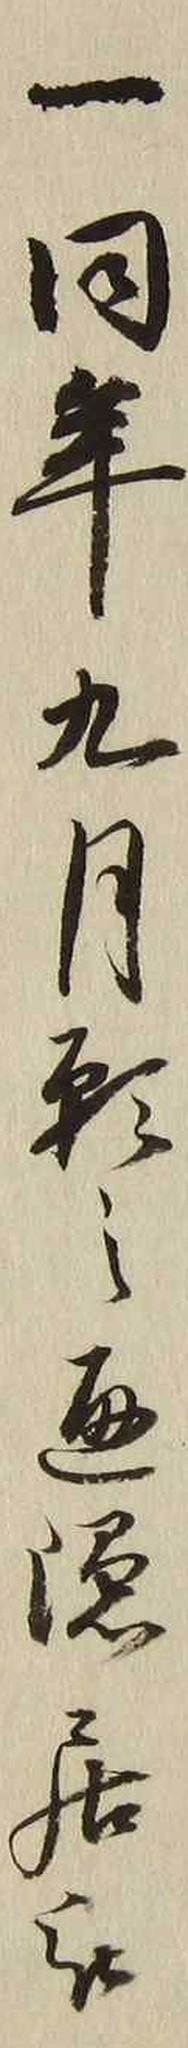一同年九月願之通隠居被
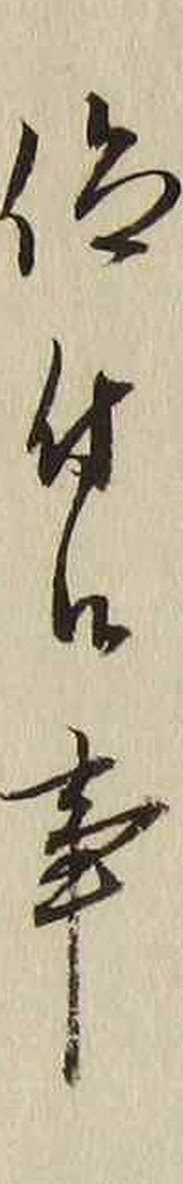仰付候事
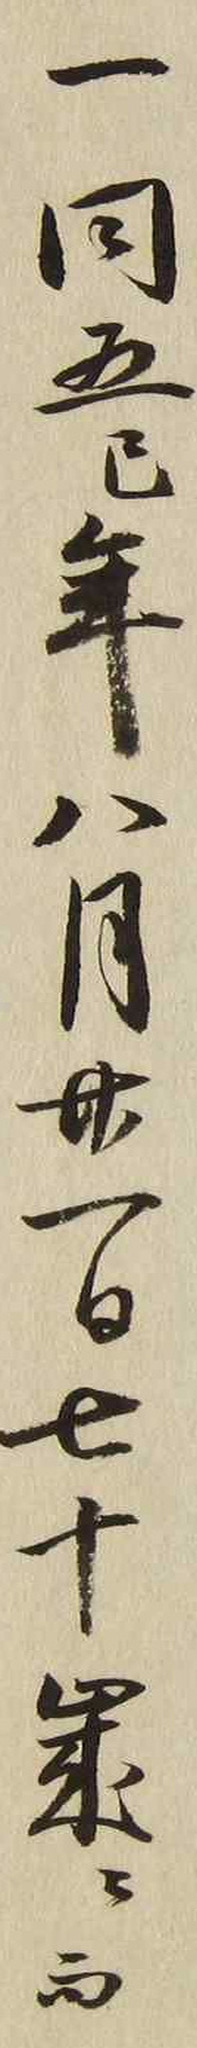一同五巳年八月廿一日七十歳ニ而
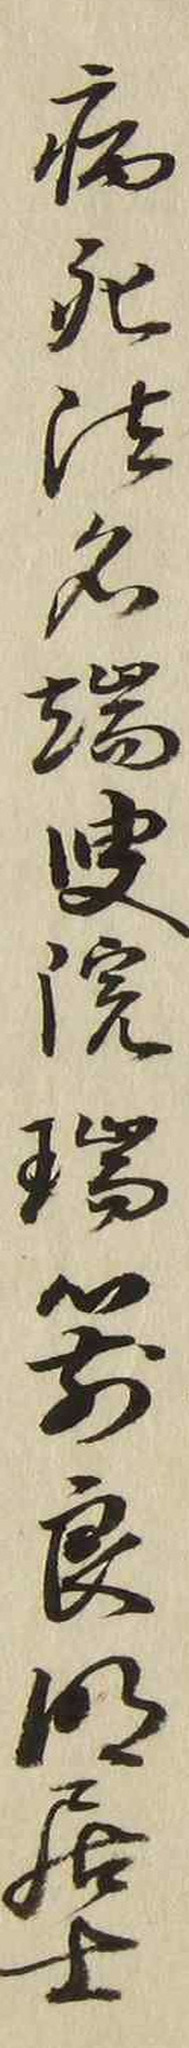病死法名端叟院瑞箭良明居士

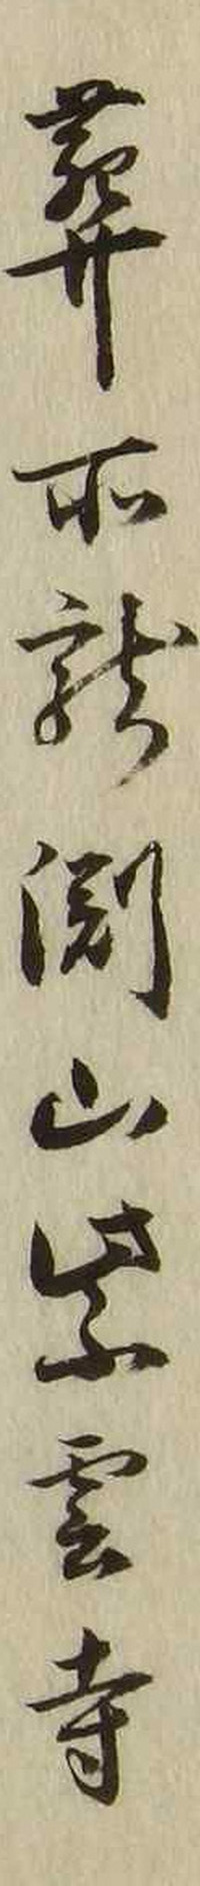葬所龍淵山紫雲寺
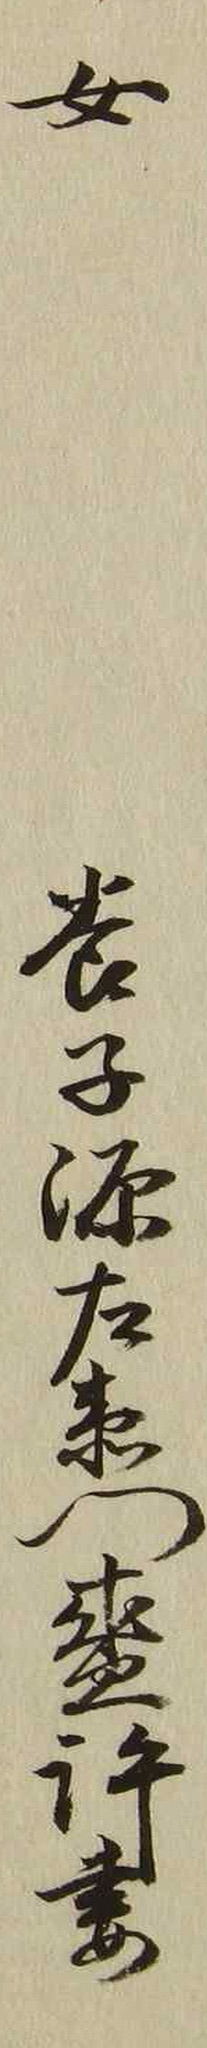女養子源左衛門盛許妻
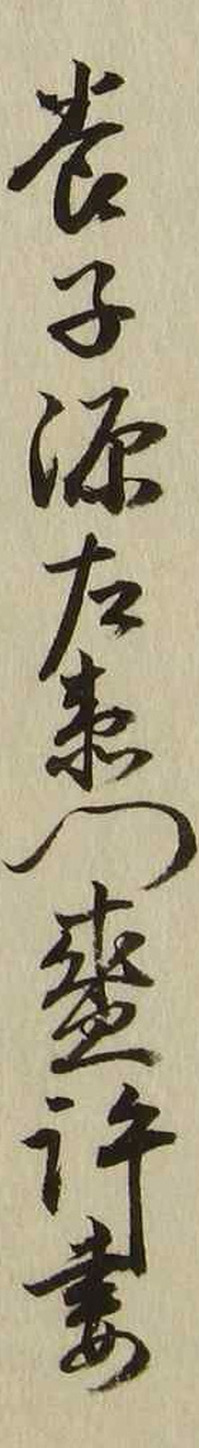女養子源左衛門盛許妻
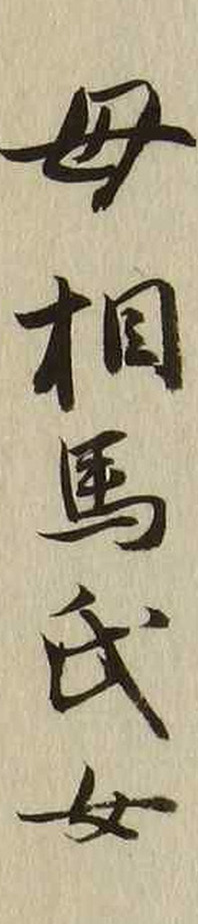母相馬氏女
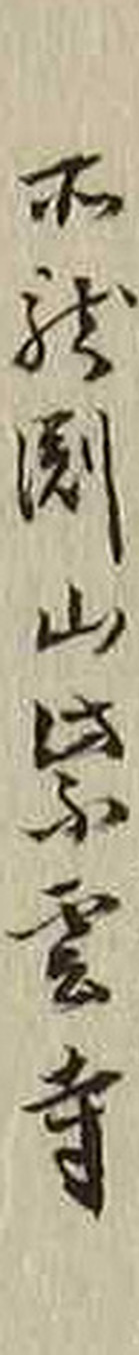葬所龍淵山紫雲寺
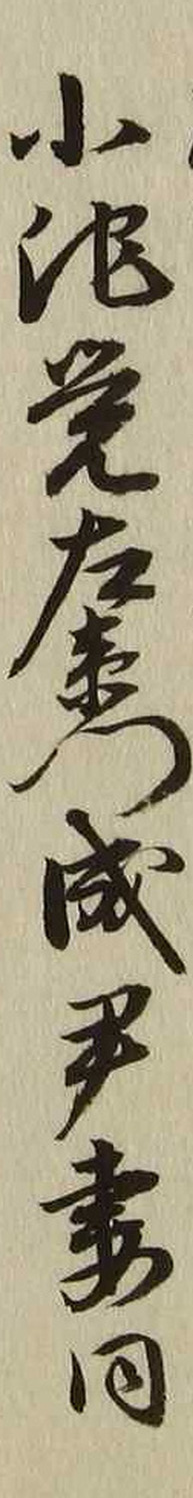小池覚左衛門成尹妻同
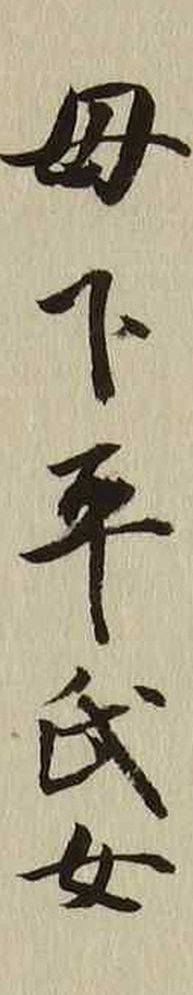母下平氏女
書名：諸士系譜　巻之61　と之部4
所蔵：会津若松市立会津図書館
